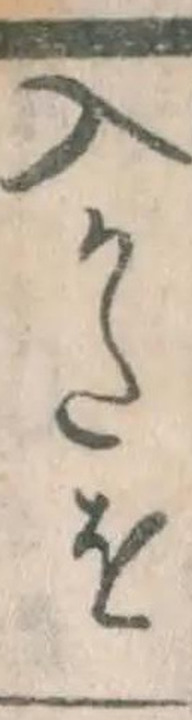入かたを
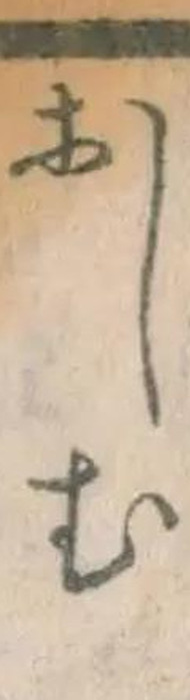おしむ
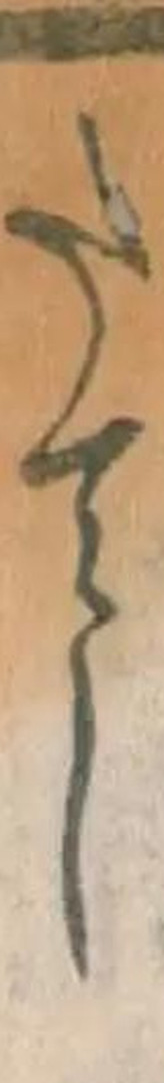たてし
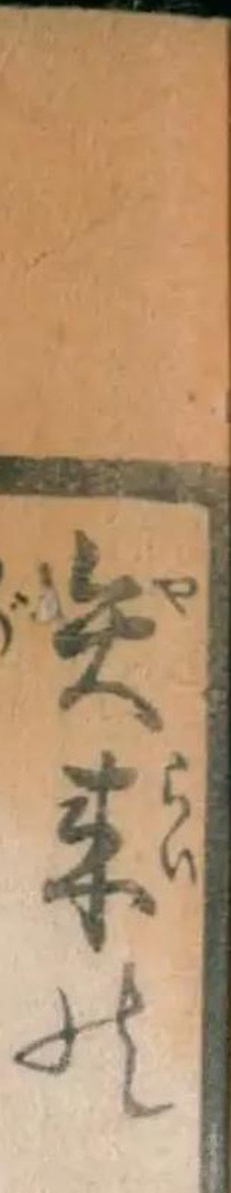矢来の
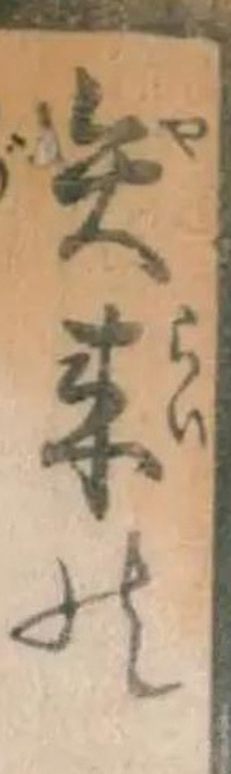矢来の
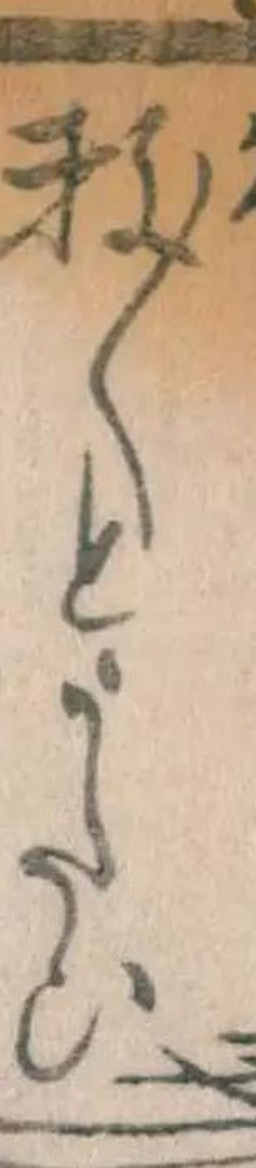数〳〵をうたひ
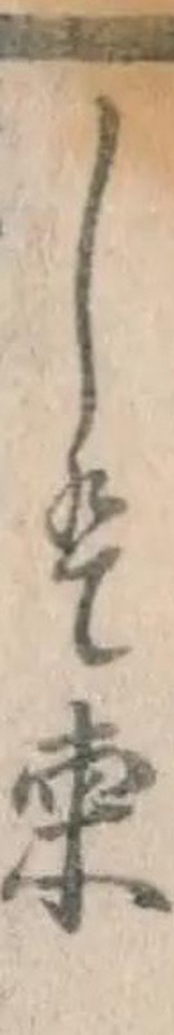しは東
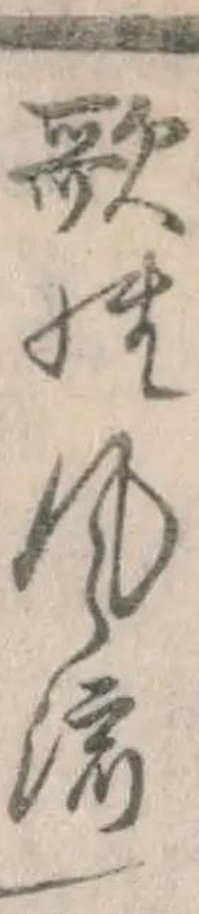歌の風流
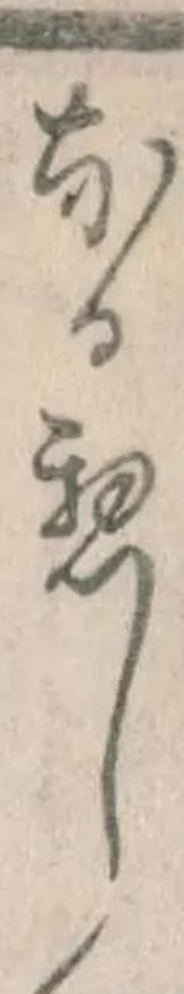なるへし
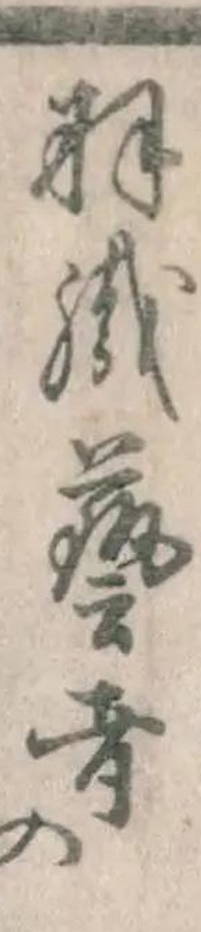羽織芸者の
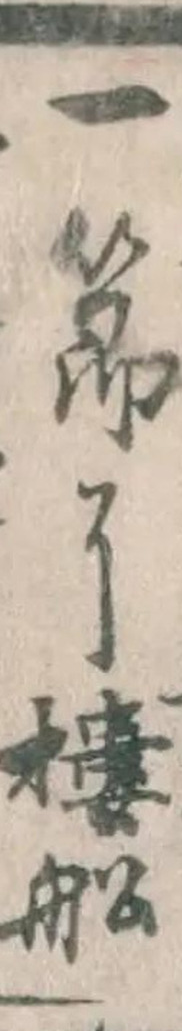一節に楼船
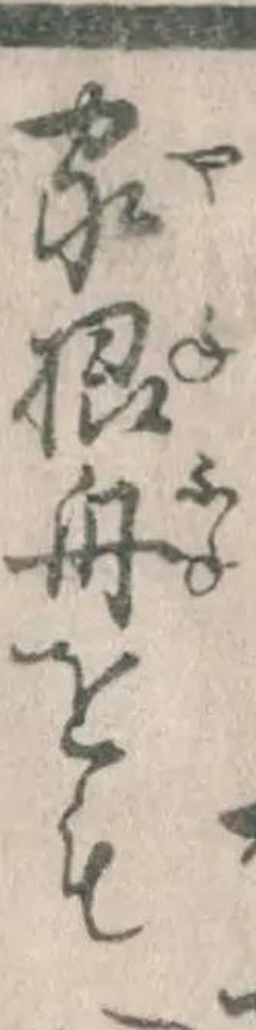家根舟をも
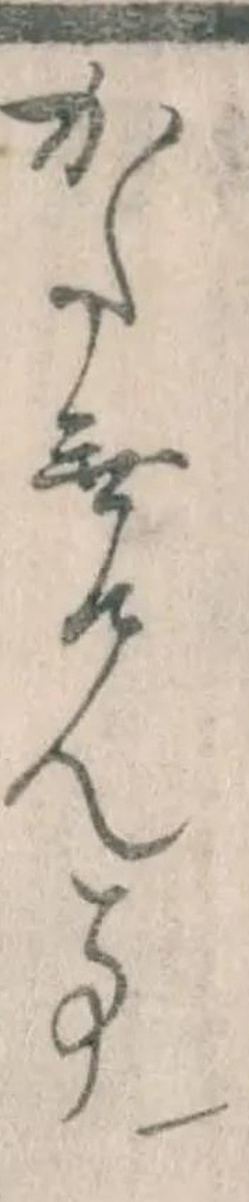かたむけん事
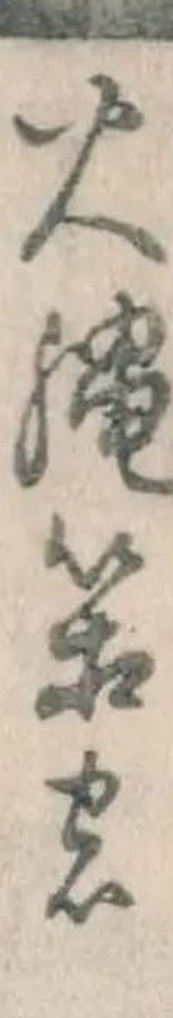火縄箱の
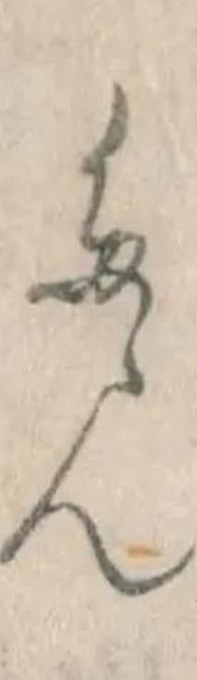たゝん

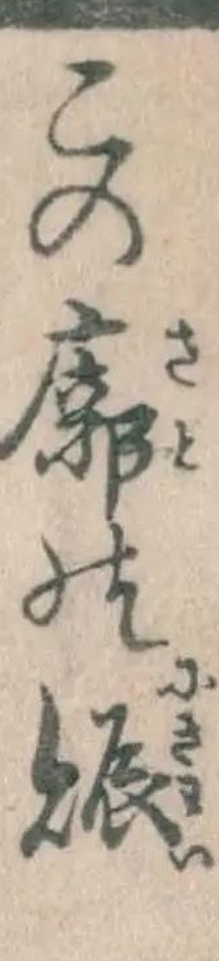この廓の賑
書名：絵本物見岡
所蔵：国立国会図書館 National Diet Library, JAPAN
